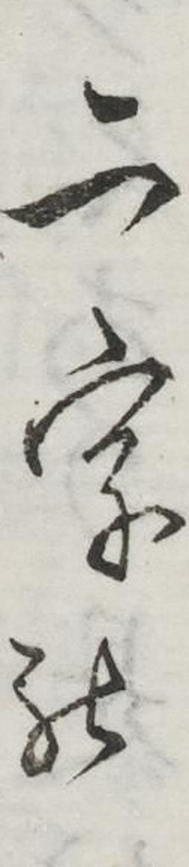二字の
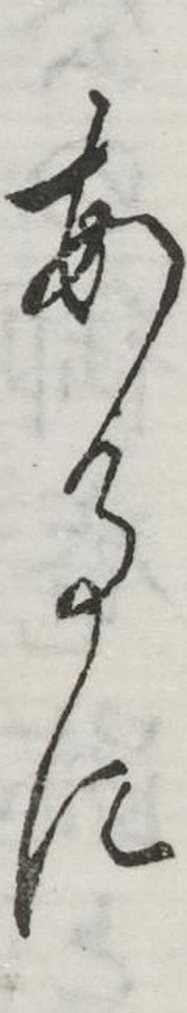あるに
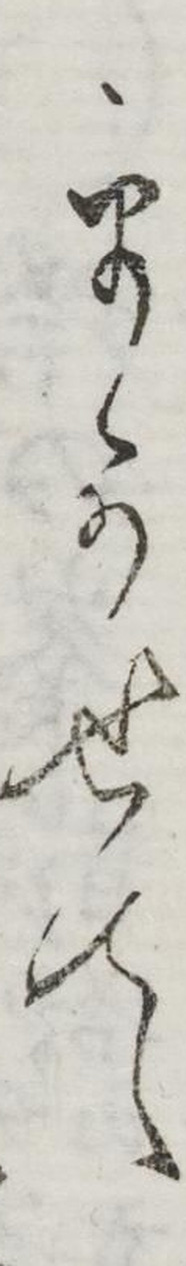まかせて

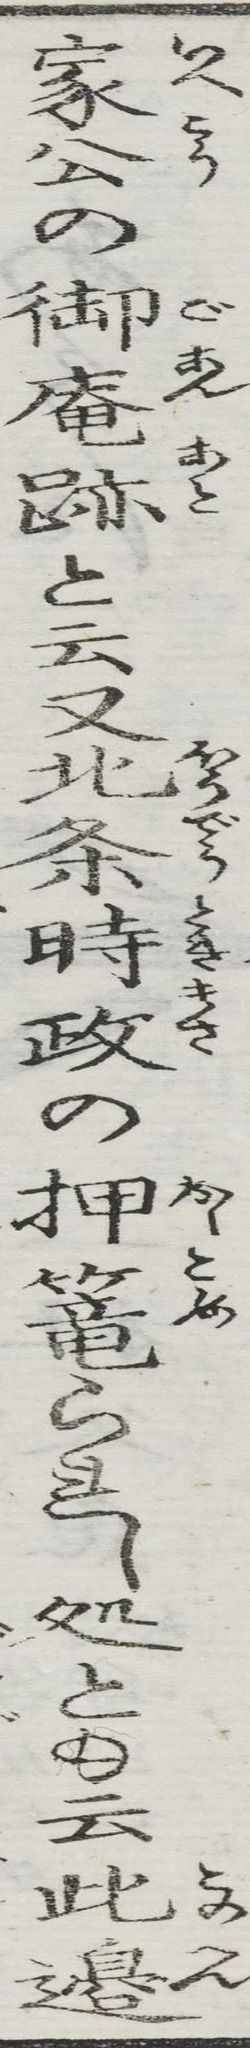家公の御庵跡と云又北条時政の押篭られし処とも云此邉
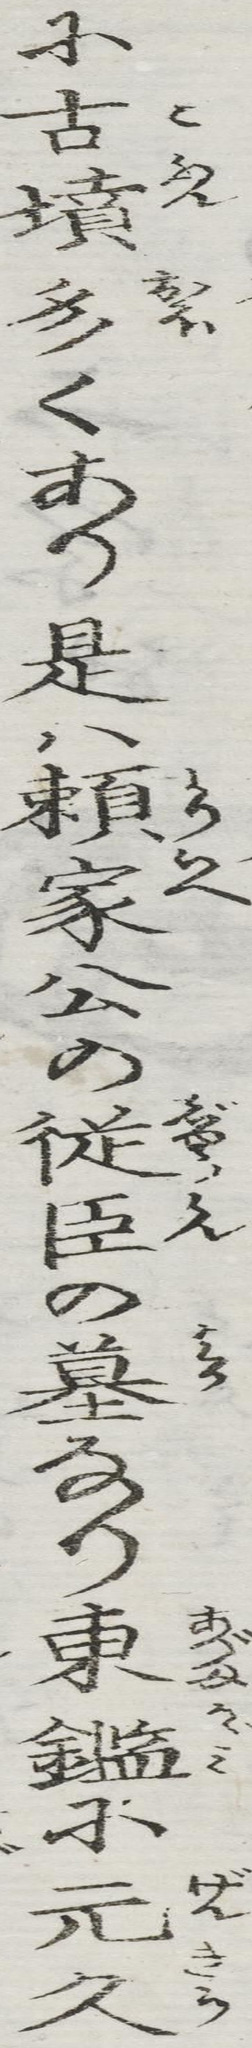に古墳多くあり是は頼家公の従臣の墓なり東鑑に元久
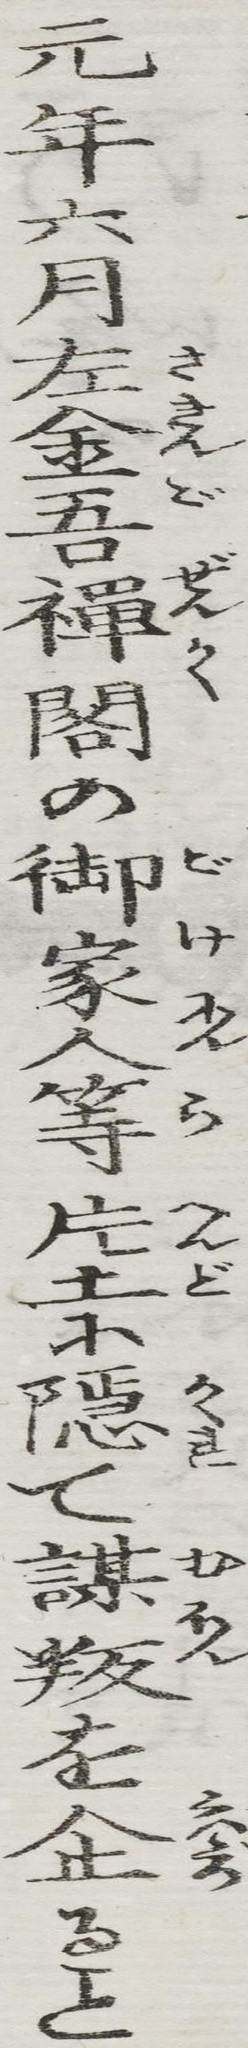元年六月左金吾禅閣の御家人等片土に隠て謀叛を企ること
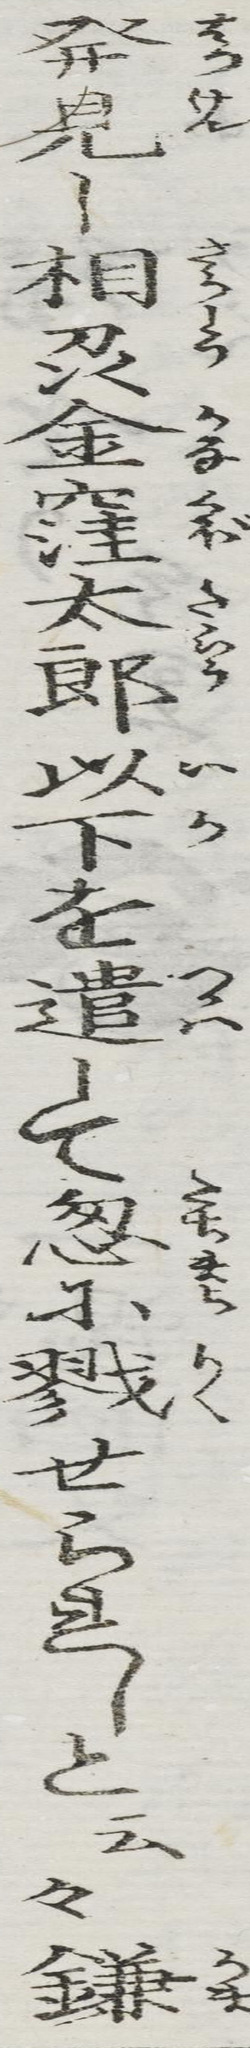発見し相州金窪太郎以下を遣して忽に戮せられてと云々鎌
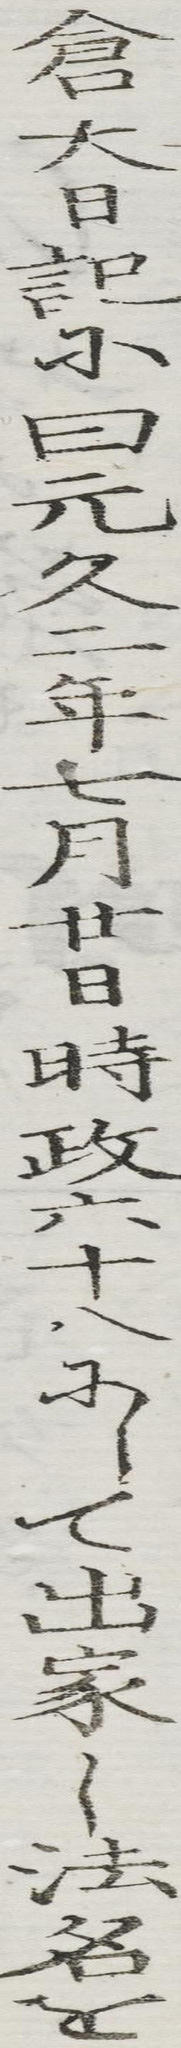倉大日記に曰元久二年七月廿日時政六十八にして出家し法名を
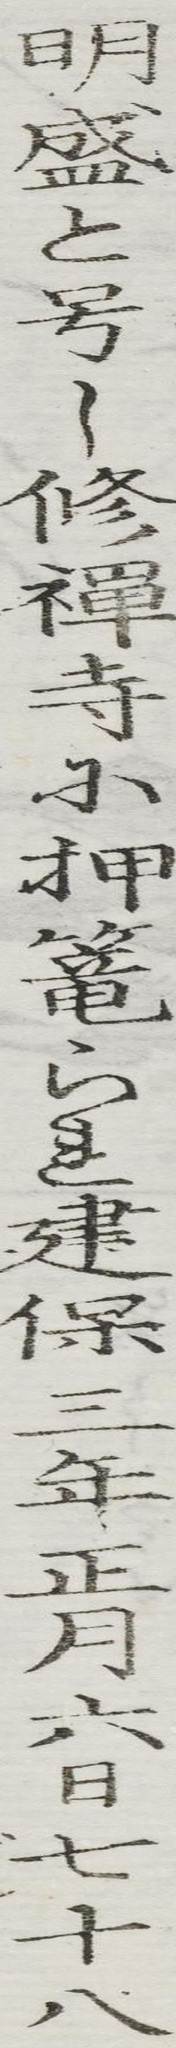明盛と号し修禅寺に押籠られ建保三年正月六日七十八
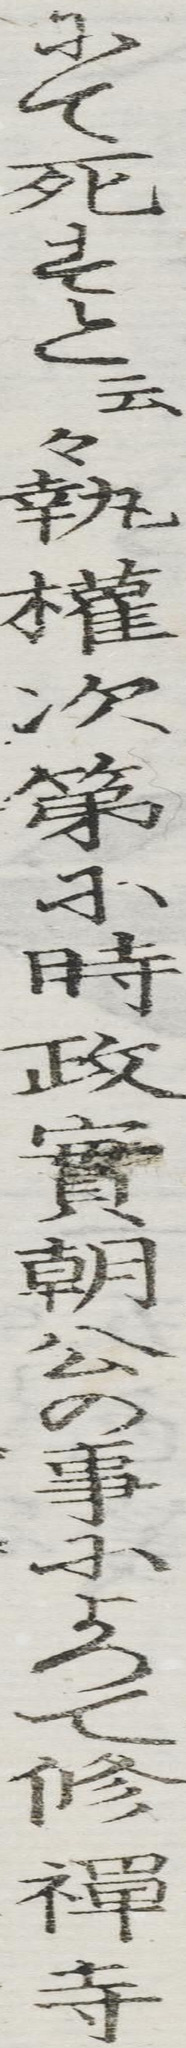にて死すと云々執権次第に時政實朝公の事によつて修禅寺
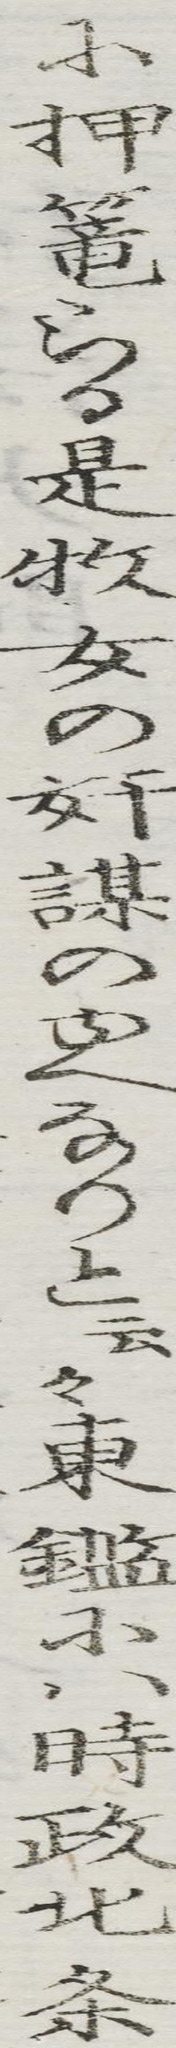に押籠らる是牧女の奸謀のゆへなりと云々東鑑にハ時政北条
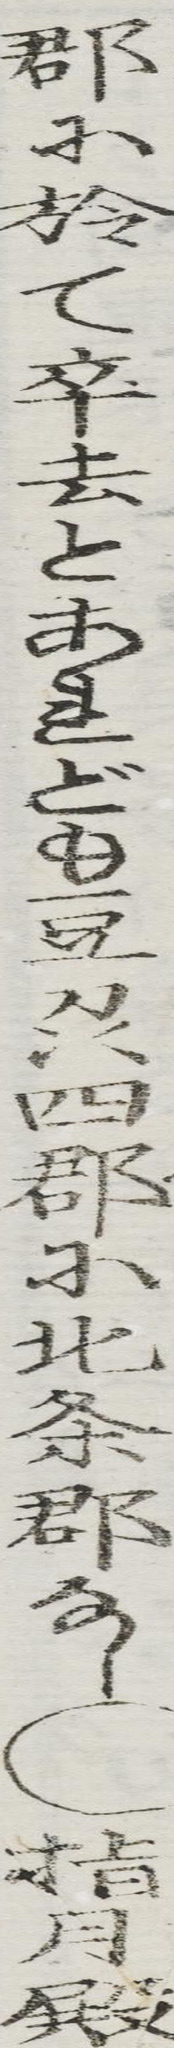郡に於て卒去とあれども豆州四郡に北条郡なし○指月殿
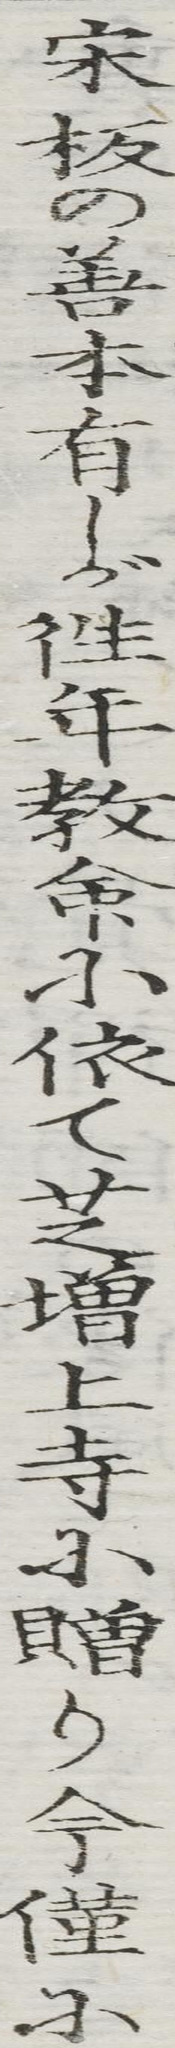宋板の善本有しが往年教命に依て芝増上寺に贈り今僅に
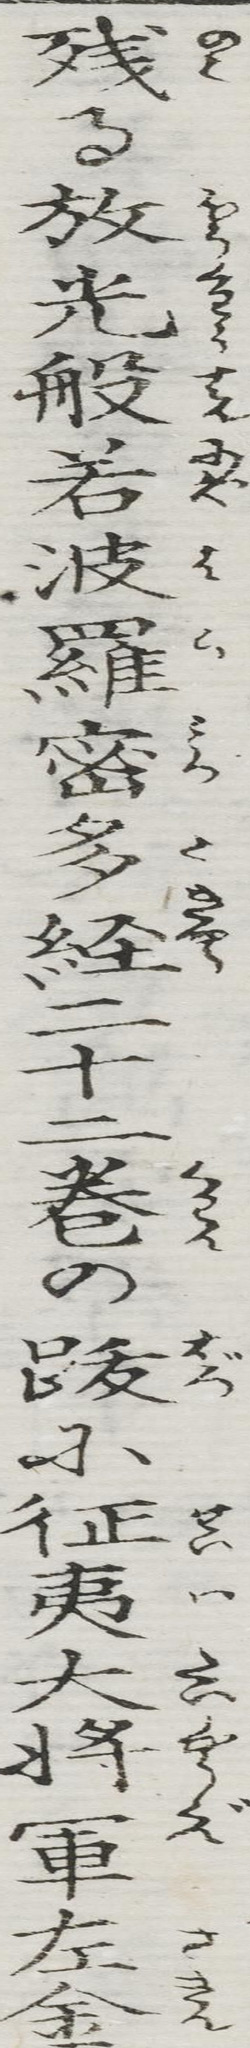残る放光般若波羅密多経二十二巻の跋に征夷大将軍左金
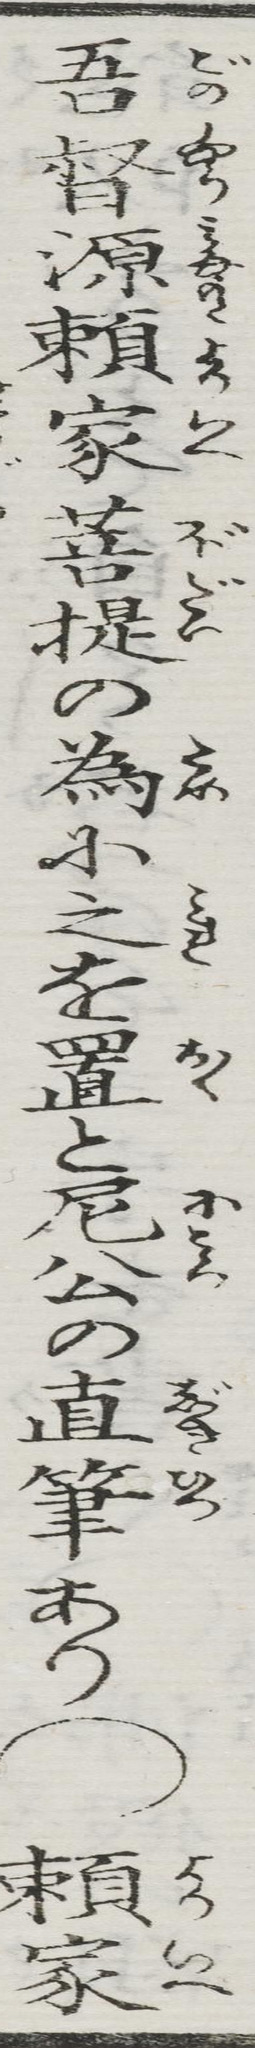吾督源頼家菩提の為に之を置と尼公の直筆あり○頼家
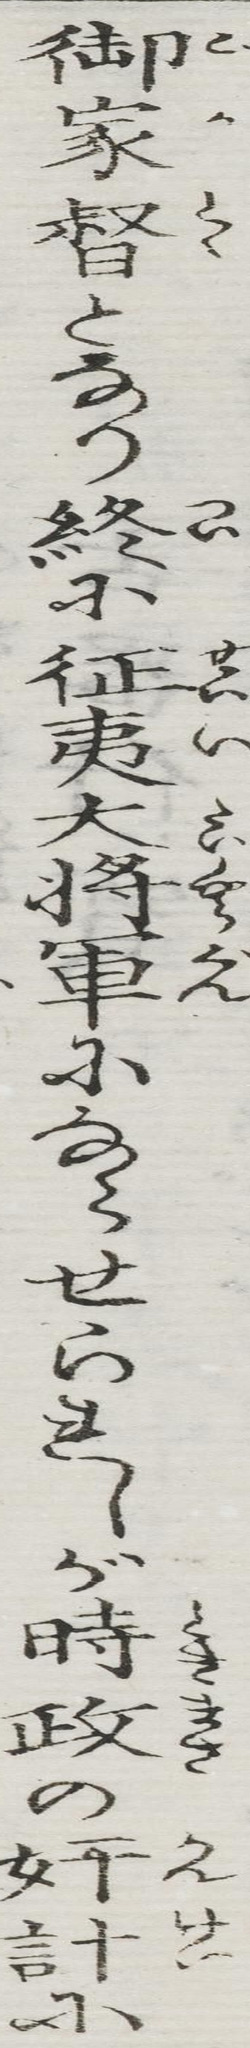御家督となり終に征夷大将軍にならせられしが時政の奸計に
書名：伊豆国修善寺温泉名所記　全
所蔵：東京大学地震研究所図書室 Earthquake Research Institute Library, The University of Tokyo, JAPAN
